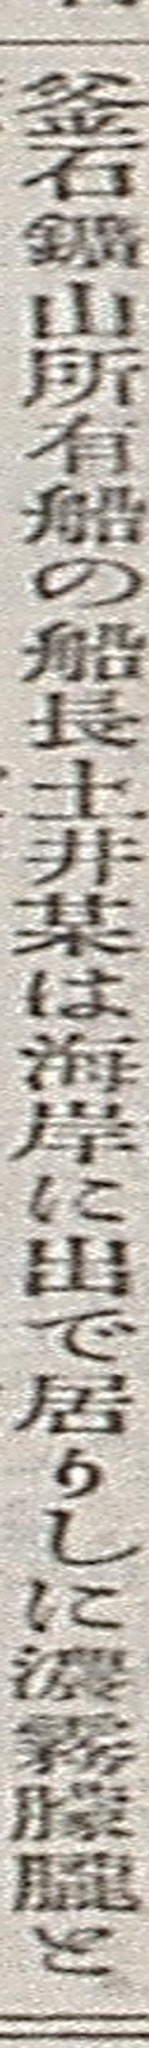釜石鉱山所有船の船長土井某は海岸に出で居りしに濃霧朦朧と
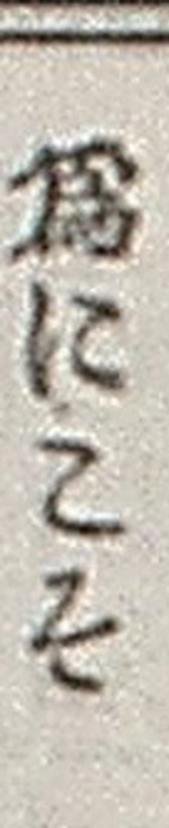為にこそ
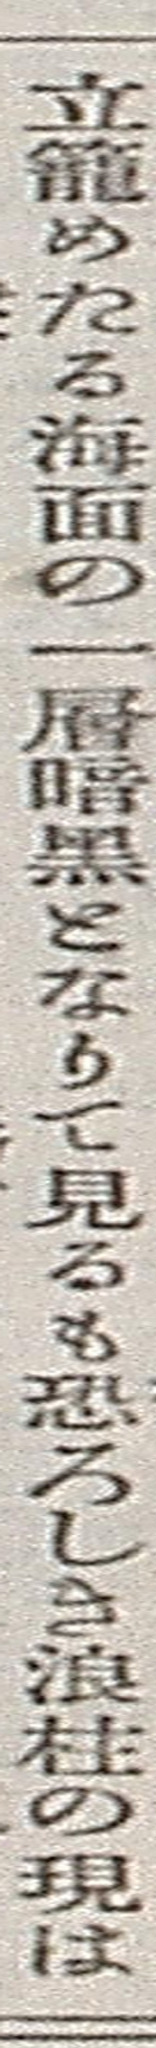立籠めたる海面の一層暗黒となりて見るも恐ろしき浪柱の現は
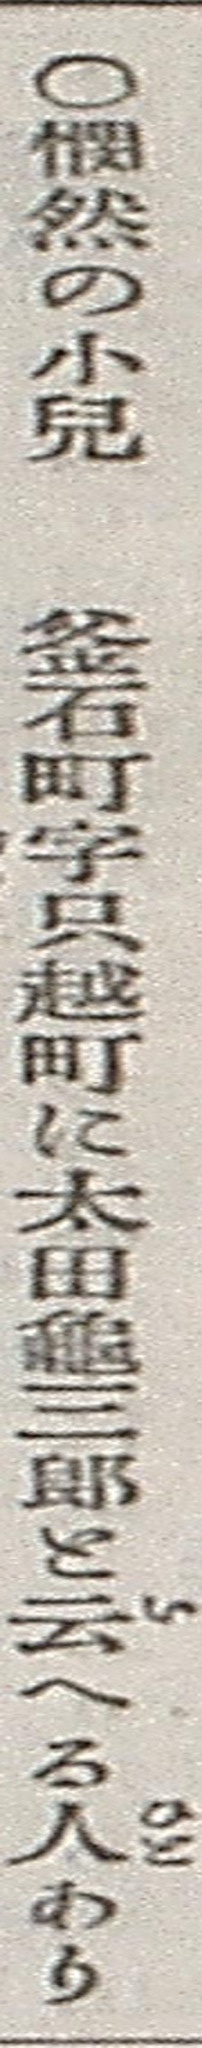○憫然の小兒釜石町字只越町に太田亀三郎と云へる人あり
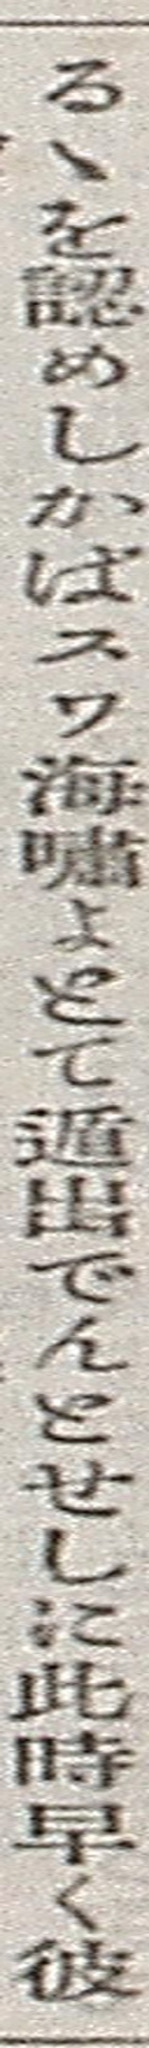るゝを認めしかばスワ海嘯よとて遁出でんとせしに此時早く彼
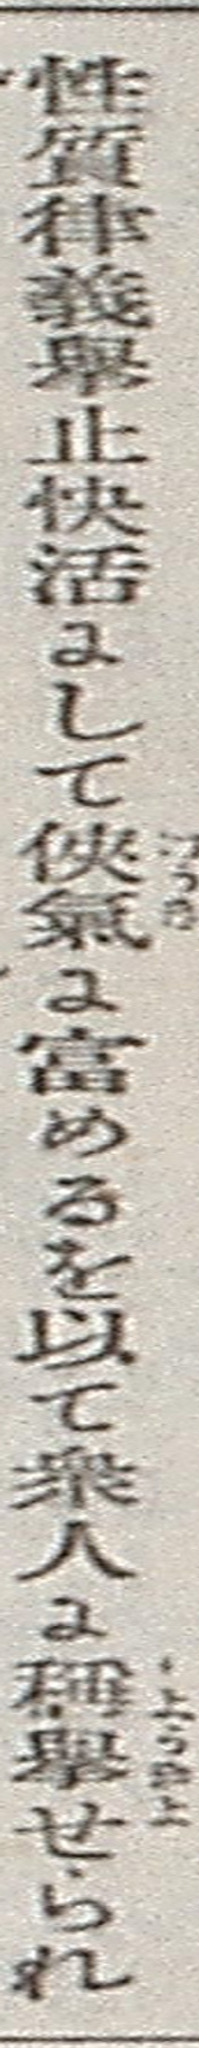性質律儀挙止快活にして侠気に富めるを以て衆人に称挙せられ
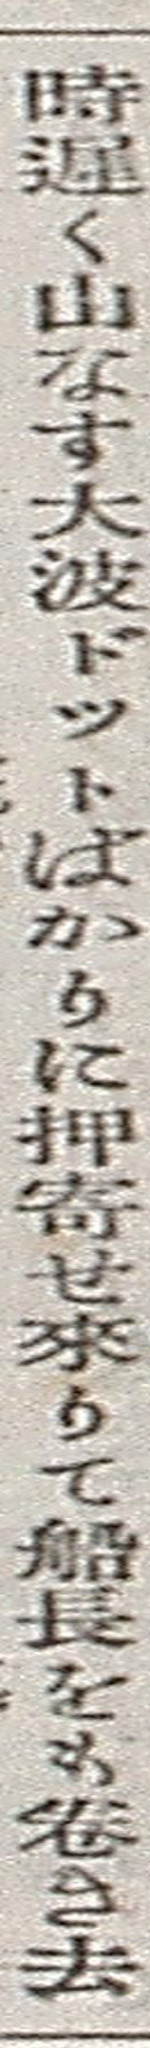時遅く山なす大波ドツトばかりに押寄せ来りて船長をも巻き去
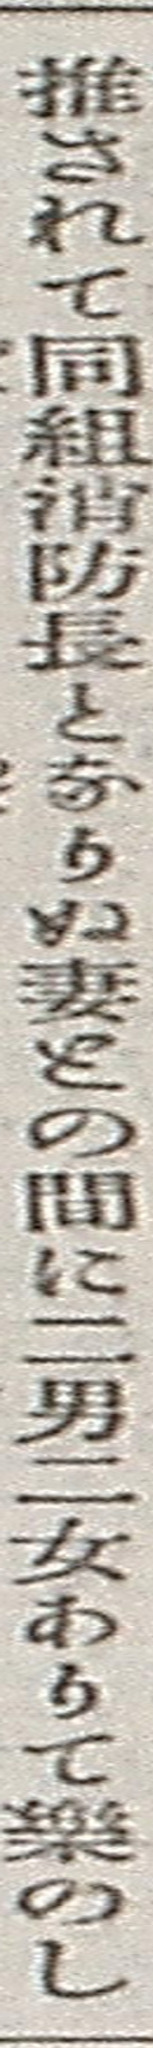推されて同組消防長となりぬ妻との間にニ男二女ありて楽のし
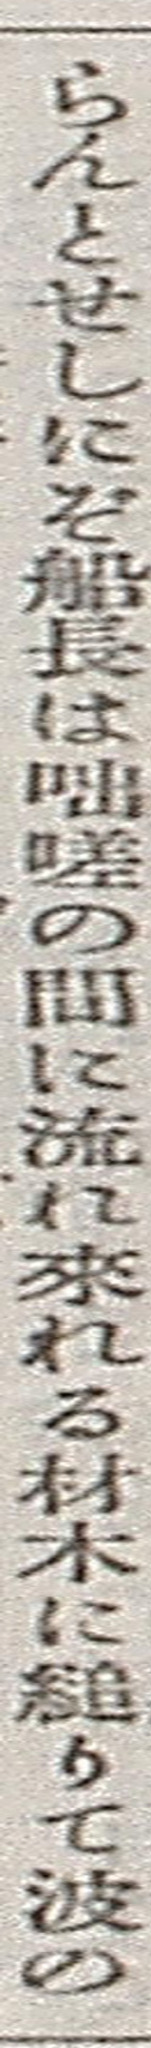らんとせしにぞ船長は咄嗟の間に流れ来れる材木に縋りて波の
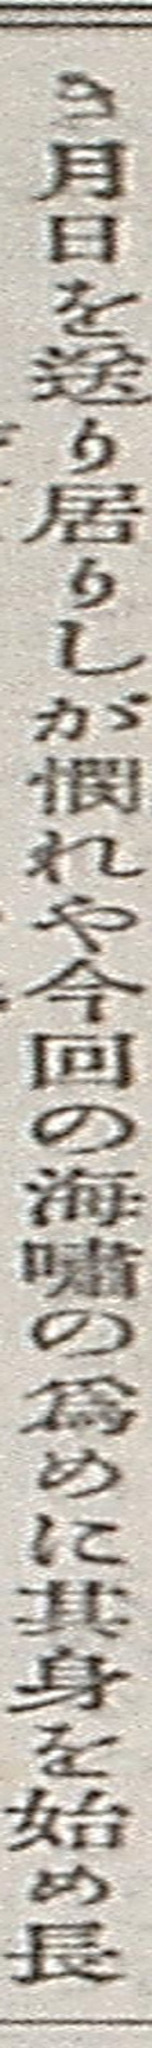き月日を送り居りしが憫れや今回の海嘯の為めに其身を始め長
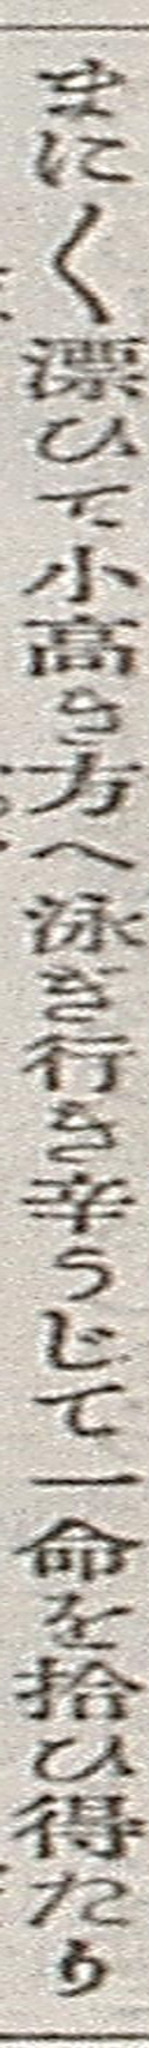まに〳〵漂ひて小高き方へ泳ぎ行き辛うじて一命を拾ひ得たり
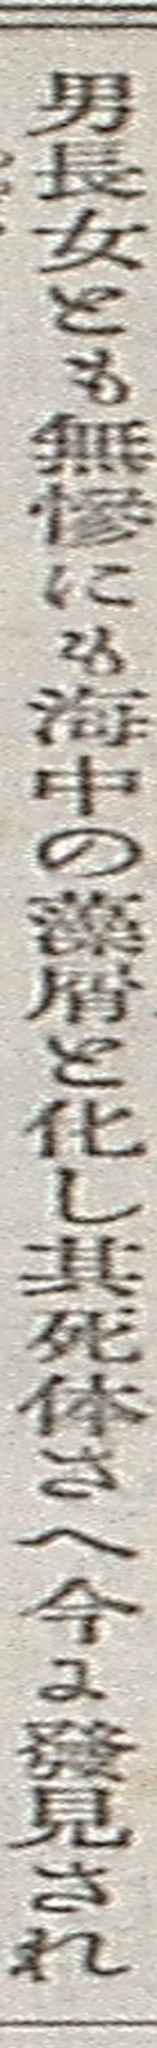男長女とも無惨にも海中の藻屑と化し其死体さへ今に発見され
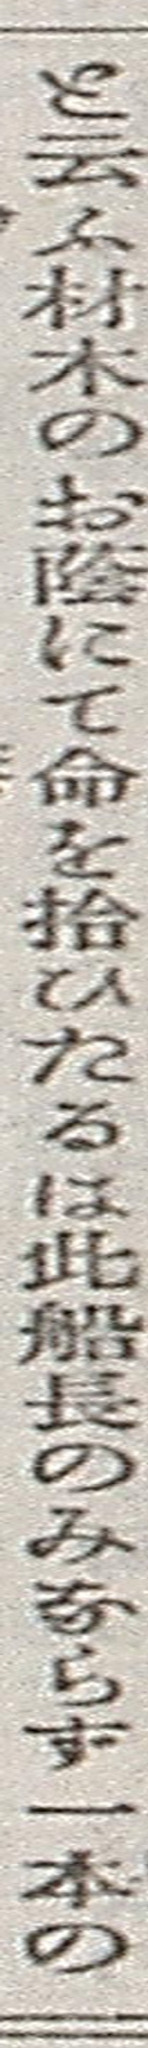と云ふ材木のお蔭にて命を拾ひたるは此船長のみならず一本の
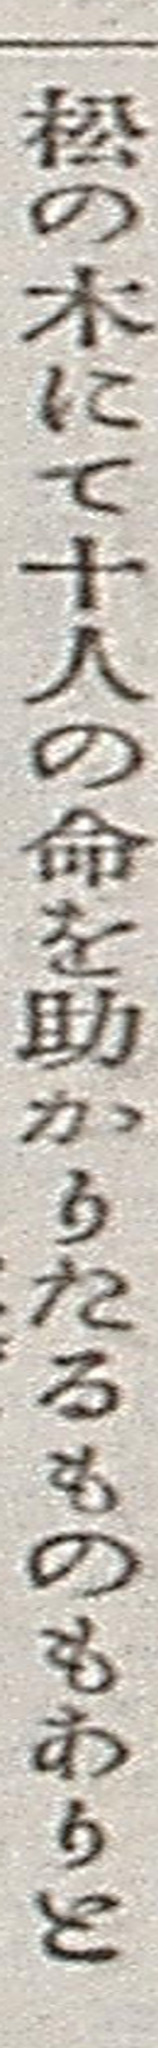松の木にて十人の命を助かりたるものもありと
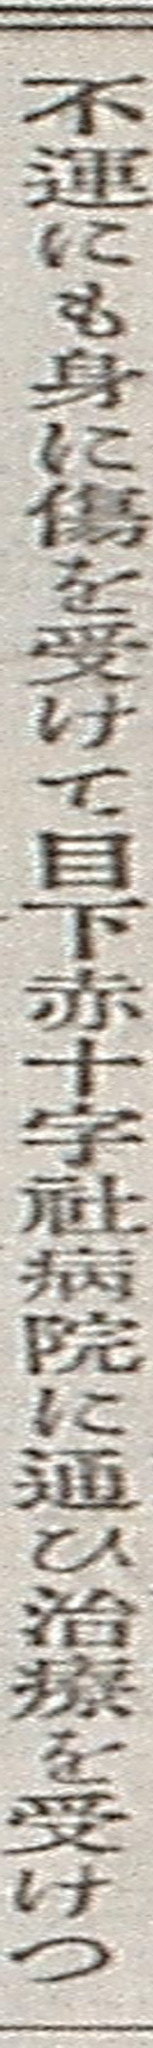不運にも身に傷を受けて目下赤十字社病院に通ひ治療を受けつ
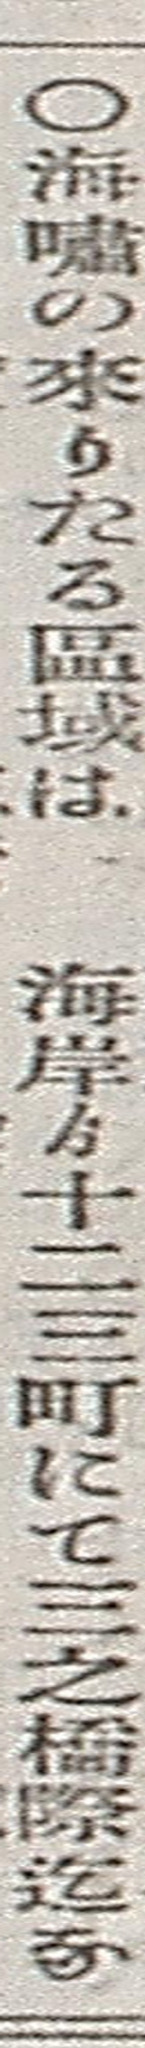○海嘯の来りたる区域は海岸ゟ十二三町にて三之橋際迄な
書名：風俗畫報臨時増刊第百二十號　大海嘯被害録（下）
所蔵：東京大学地震研究所図書室 Earthquake Research Institute Library, The University of Tokyo, JAPAN
